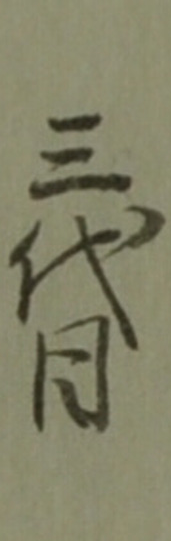三代目
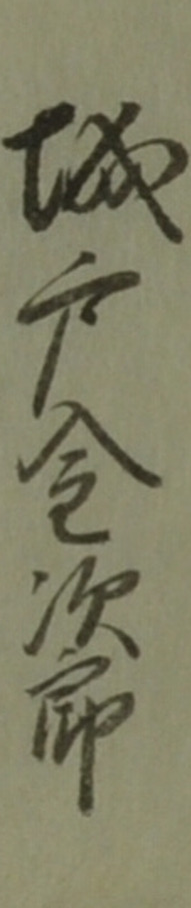城戸金次郎
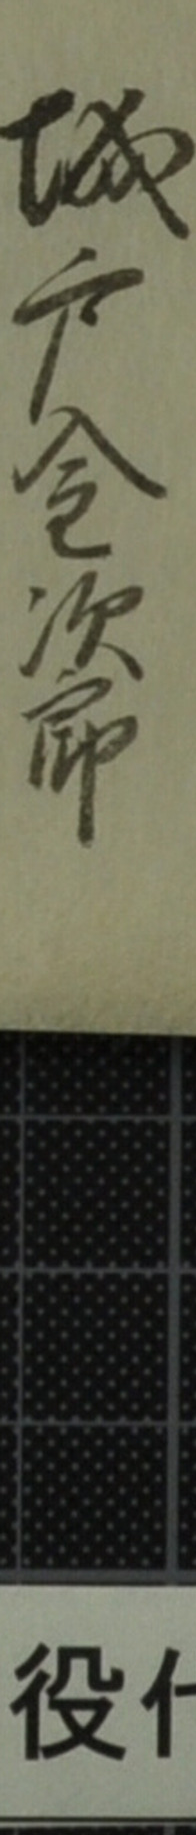城戸金次郎
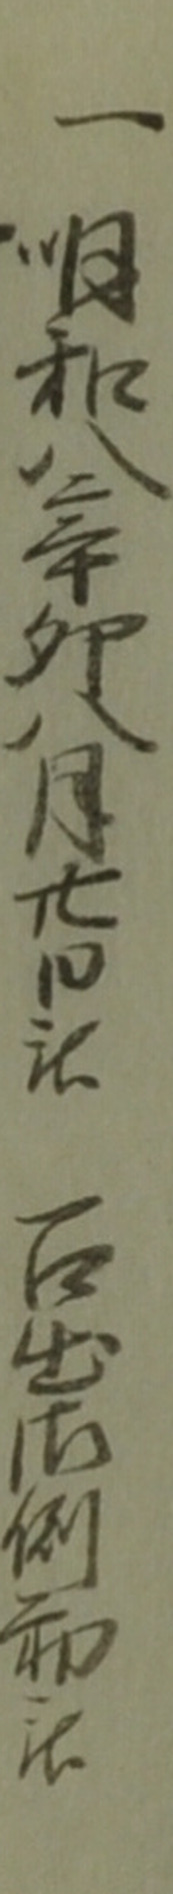一明和八辛卯八月廿日被召出御側勤被
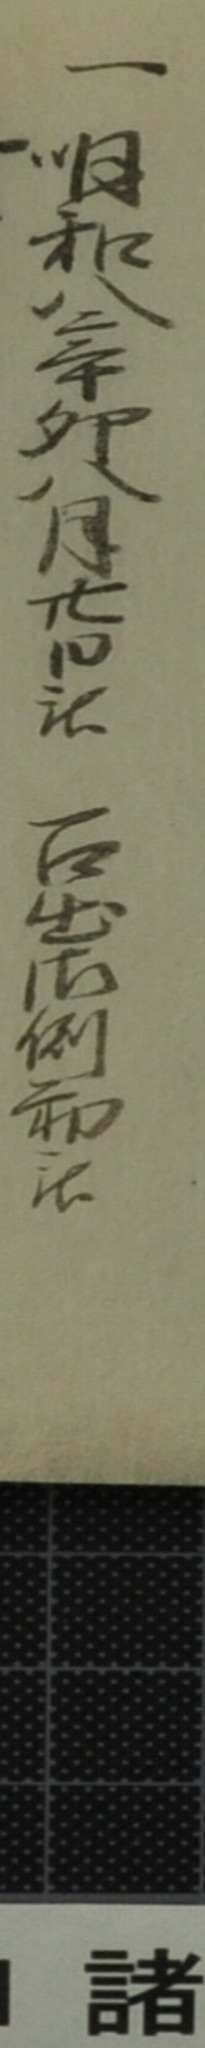一明和八辛卯八月廿日被召出御側勤被
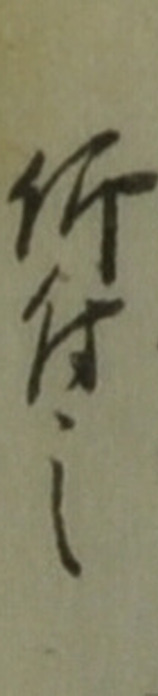仰付之
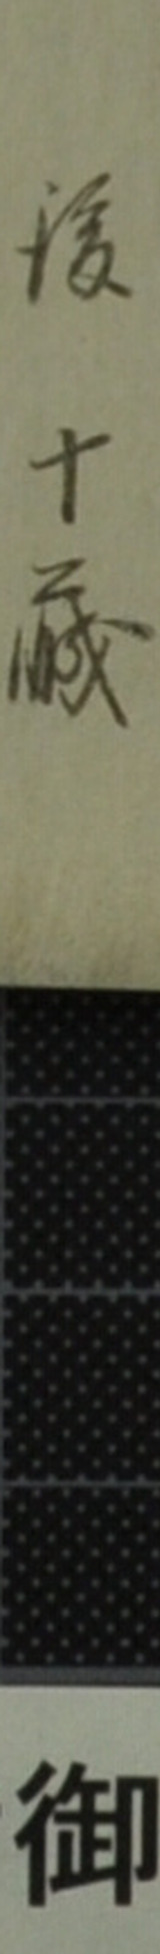後十蔵
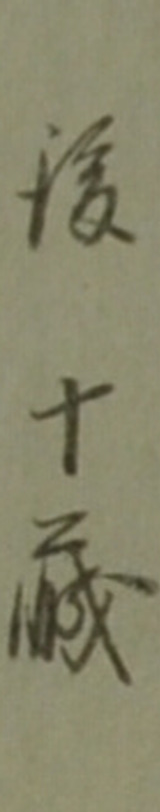後十蔵
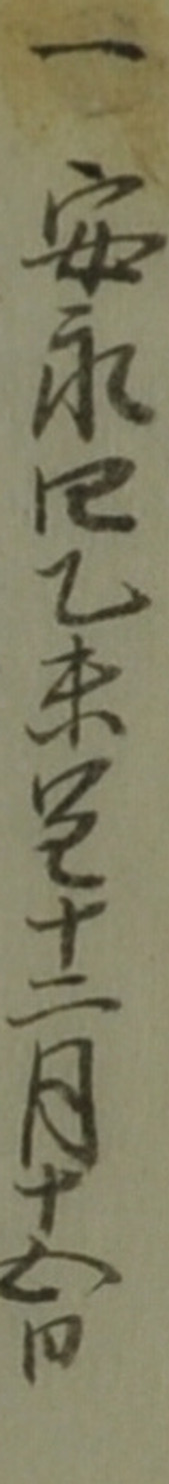一安永四乙未閏十二月十五日
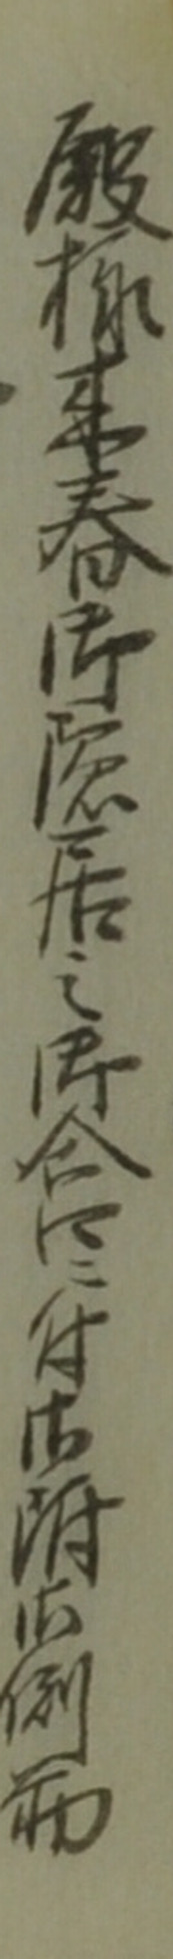殿様来春御隠居之御含ニ付御附御側勤
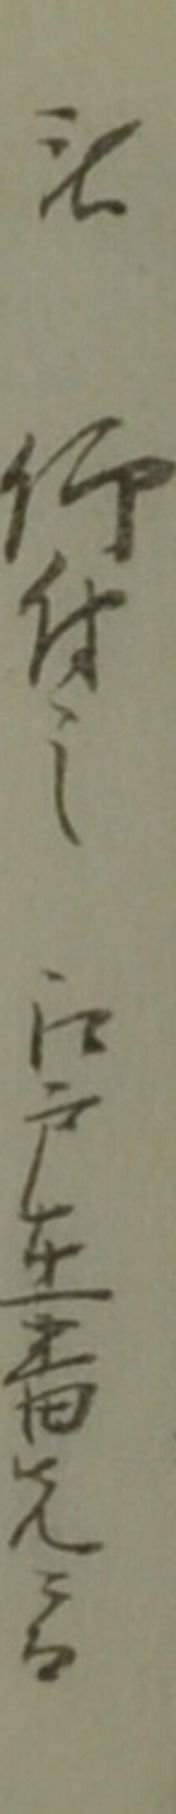被仰付之江戸在番先ニ而
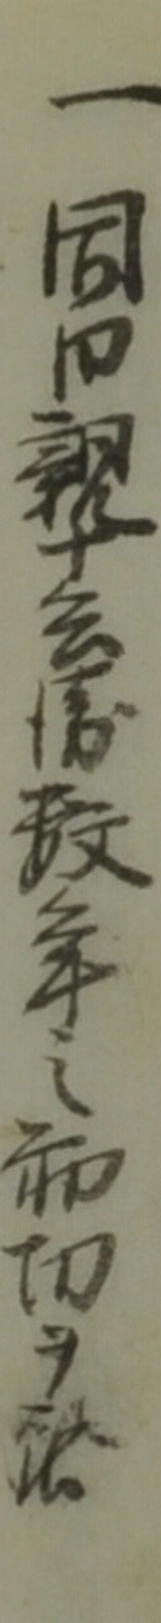一同日親十兵衛数年之勤功ヲ被
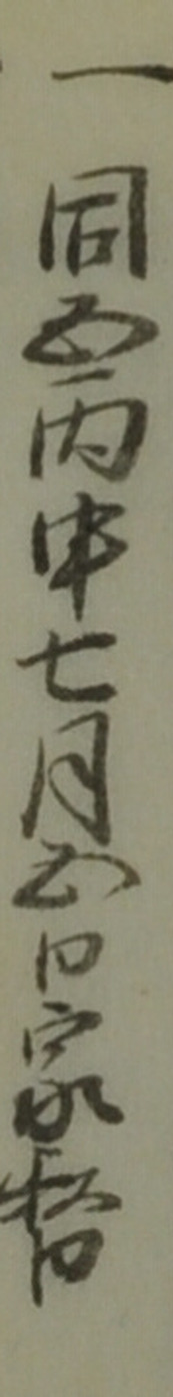一同五丙申七月五日家督
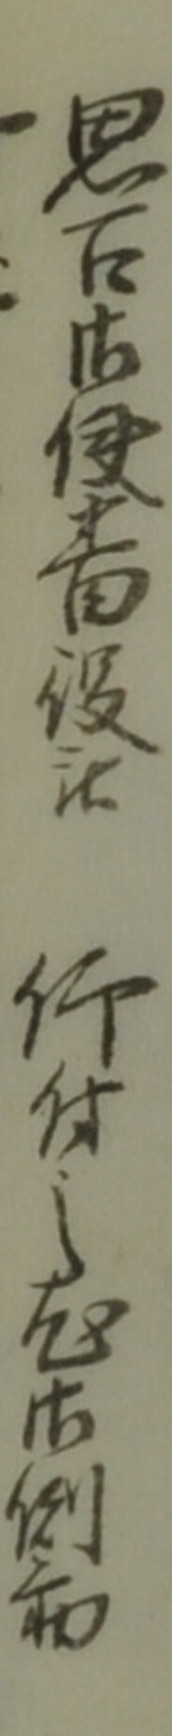思召御使番役被仰付之尤御側勤
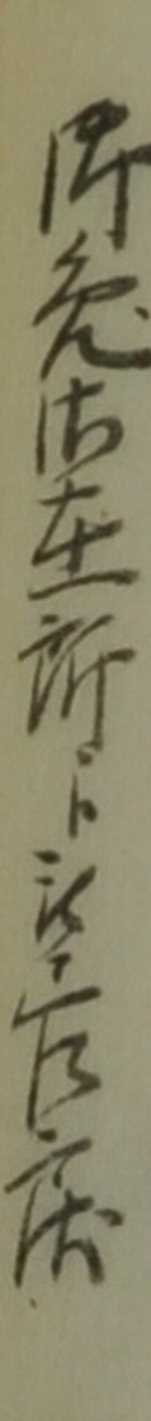御免御在所江被差戻
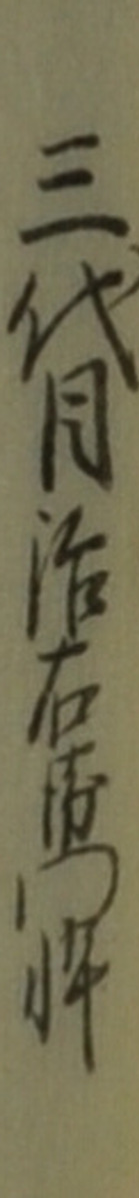三代目治右衛門忰
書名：諸御役代々録（五）
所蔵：伊那市立高遠町図書館・合同会社AMANE
